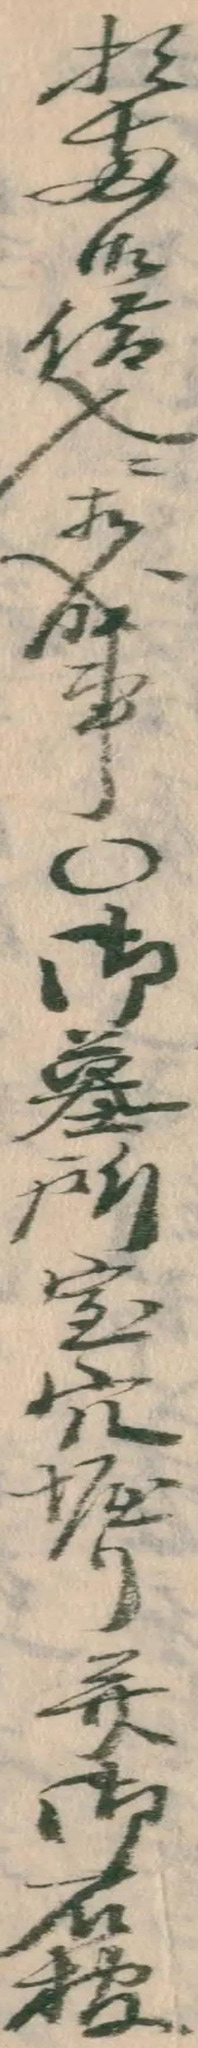拾両御借入ニ相成事○御墓所宝穴堀り幷御石棺
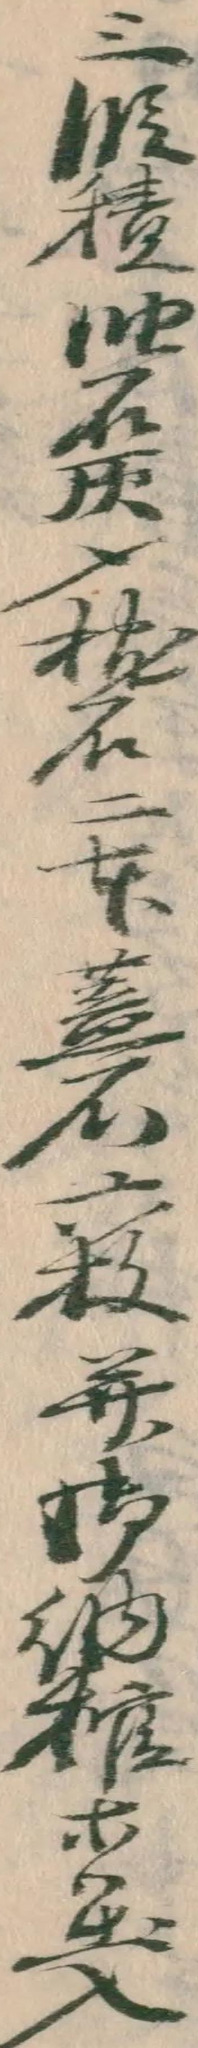三段積油石灰〆枕石二本蓋石六枚并御納棺等置入
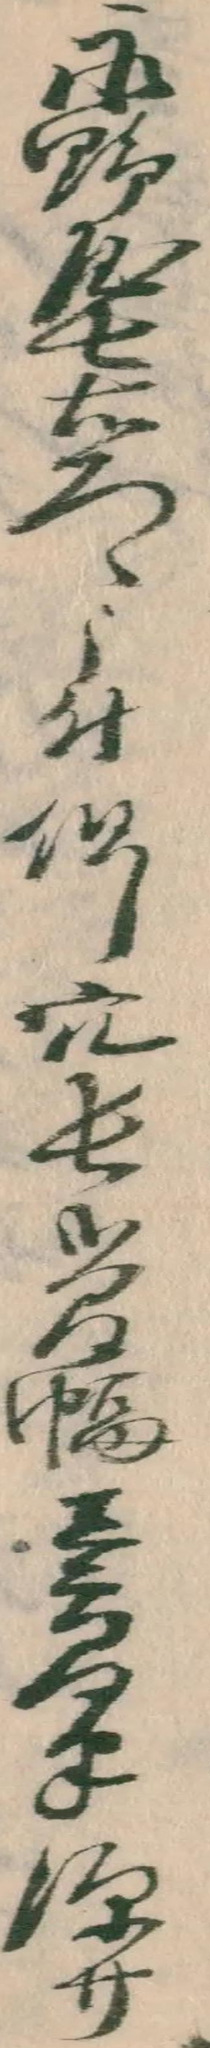永野屋七右衛門へ申付但し穴長弐間幅壱間半深サ
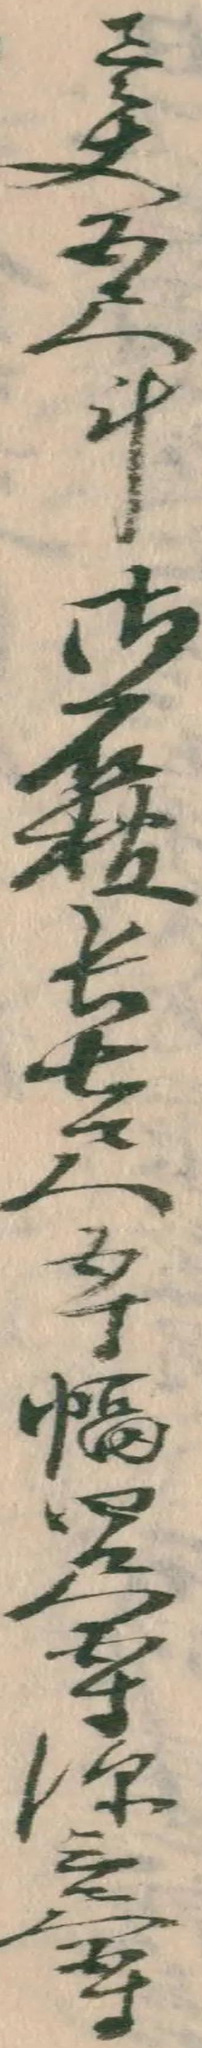壱丈五尺計御石棺長七尺五寸幅四尺五分深三尺余
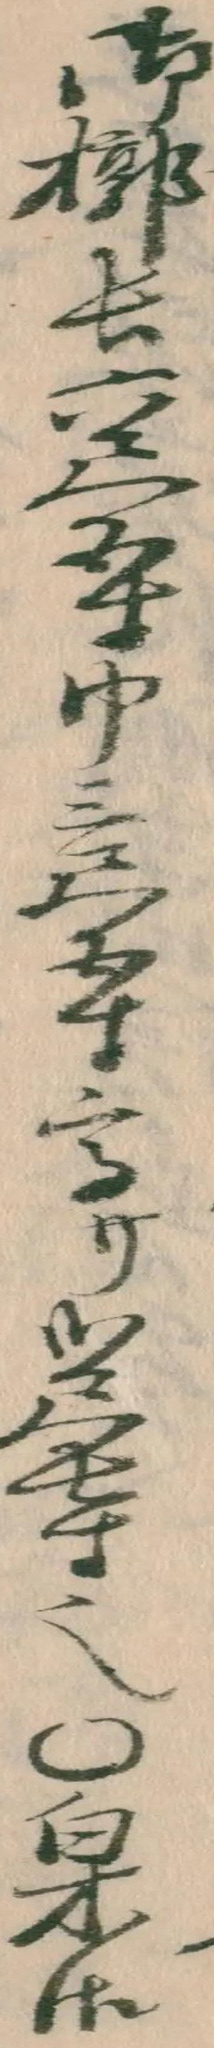御槨長六尺五寸巾三尺五分高サ弐尺七寸也○白木御
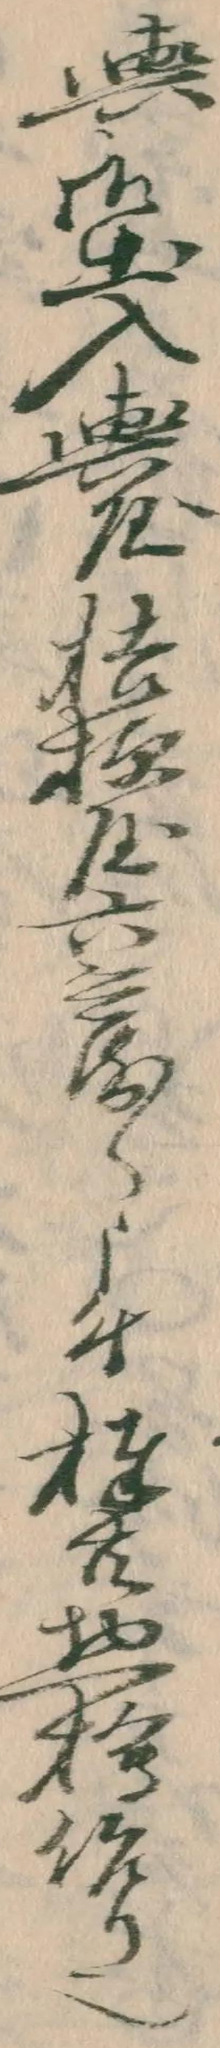輿御出入輿屋桔梗屋六兵衛ヘ申付棒共惣檜作り也
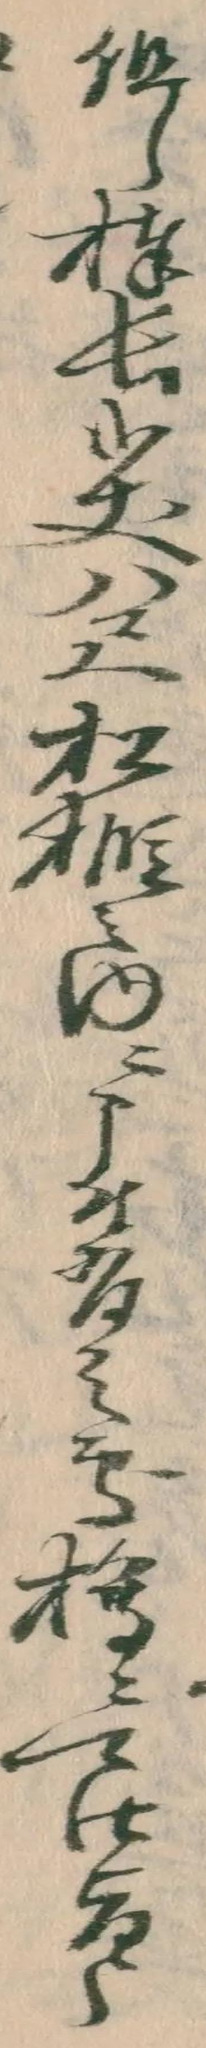但し棒長弐丈八尺松椴之内ニ申付有之處檜ニ可仕旨被
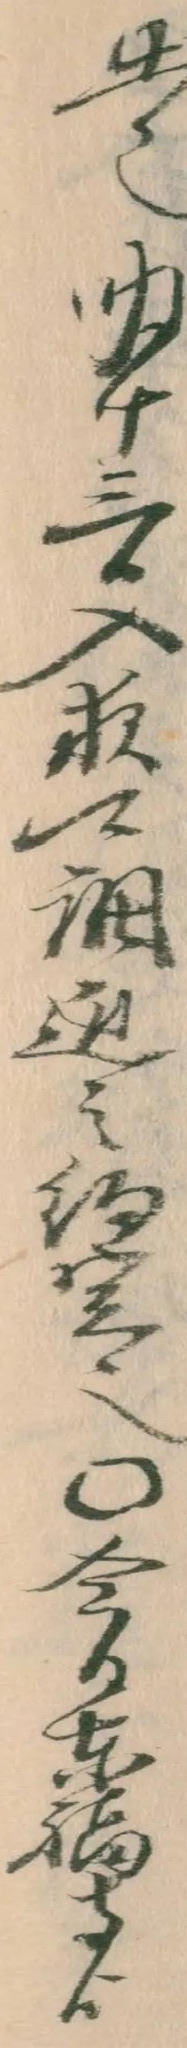出也明十三日入夜可調近之約定也○今日東福寺ゟ
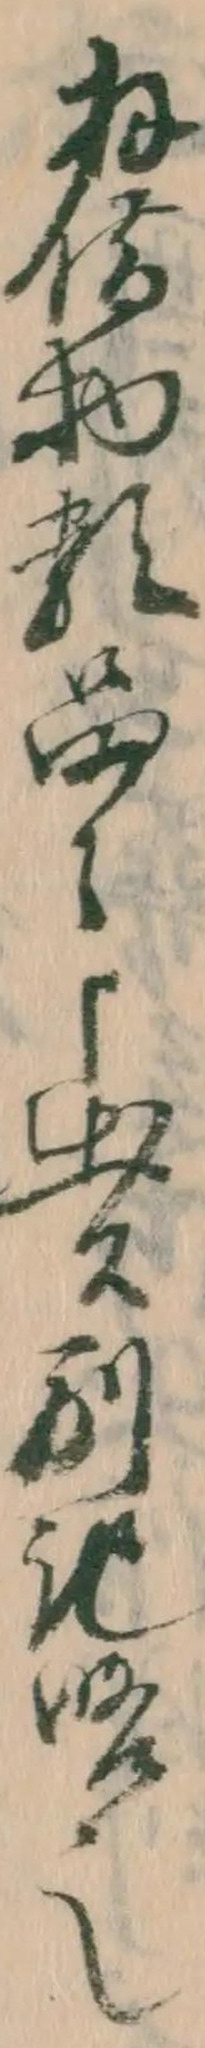拝借物類品々申出ス別記略也
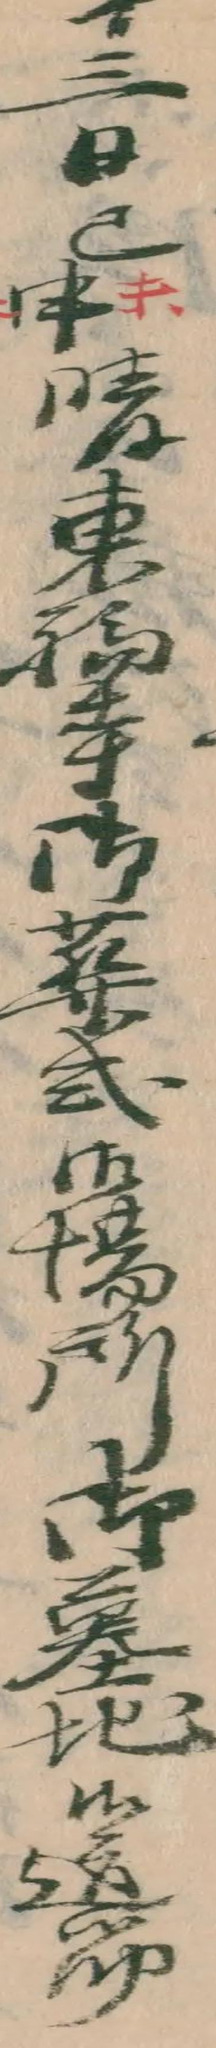十三日巳申晴東福寺御葬式御場所御墓地御道筋
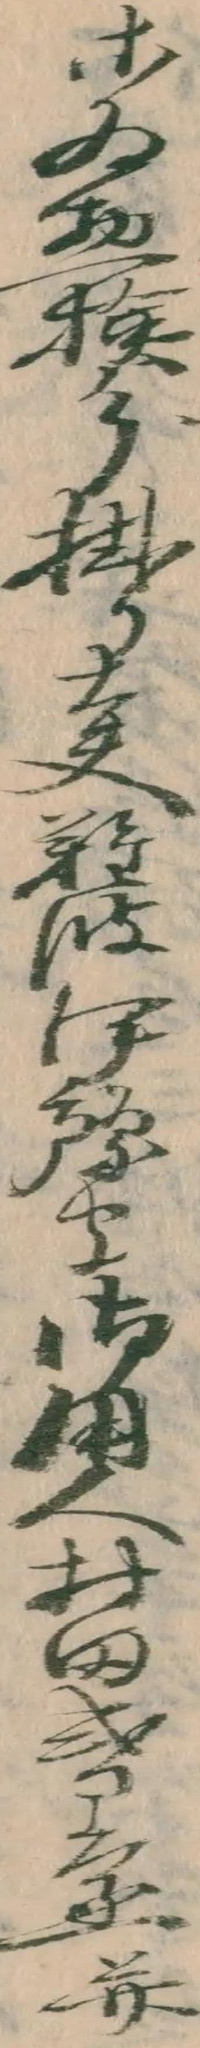等為惣検分掛り大夫難波伊豫守御用人村田式部丞幷
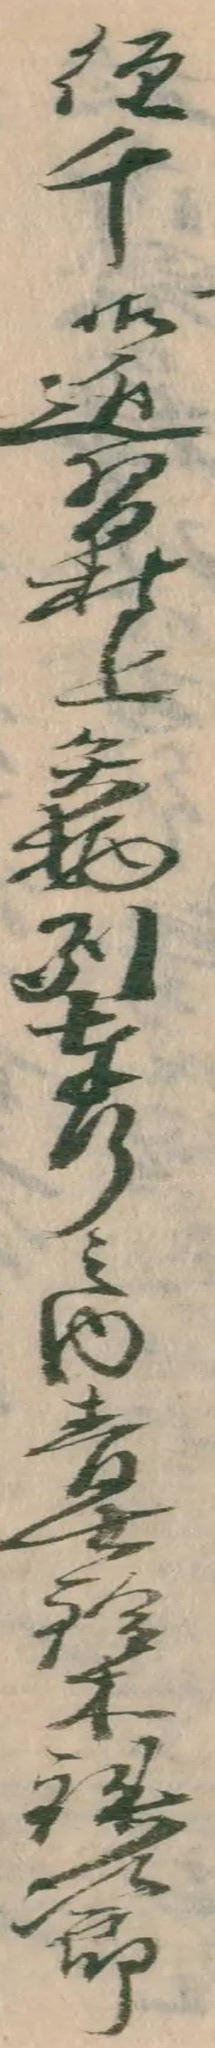経千御近習村上矢柄裂奉行之内青士鈴木鉄次郎
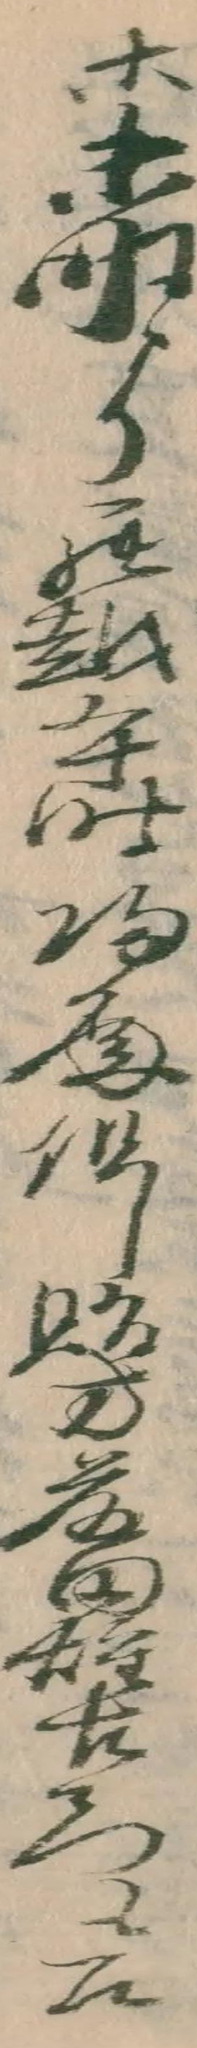等未明より罷越午時帰殿但し賄方藤田雄左衛門も召
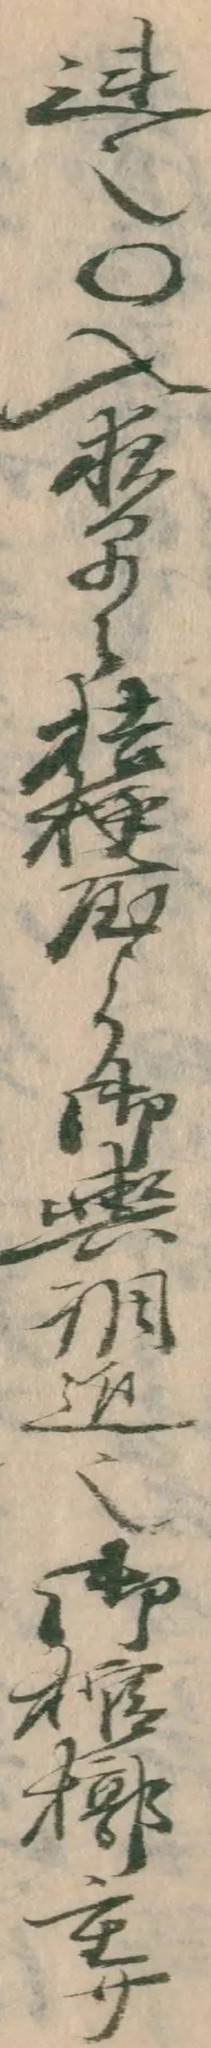連也○入夜早々桔梗屋より御輿調進也御棺槨重サ
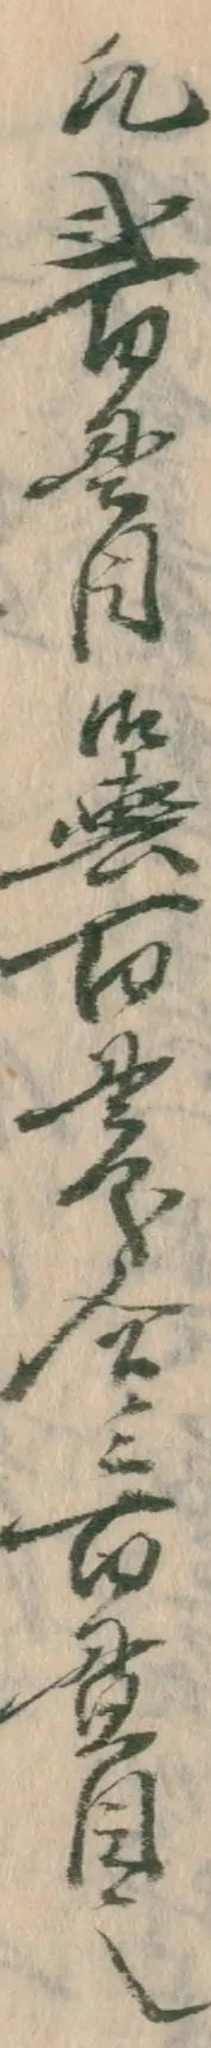凡弐百貫目御輿百貫匁合三百貫目也
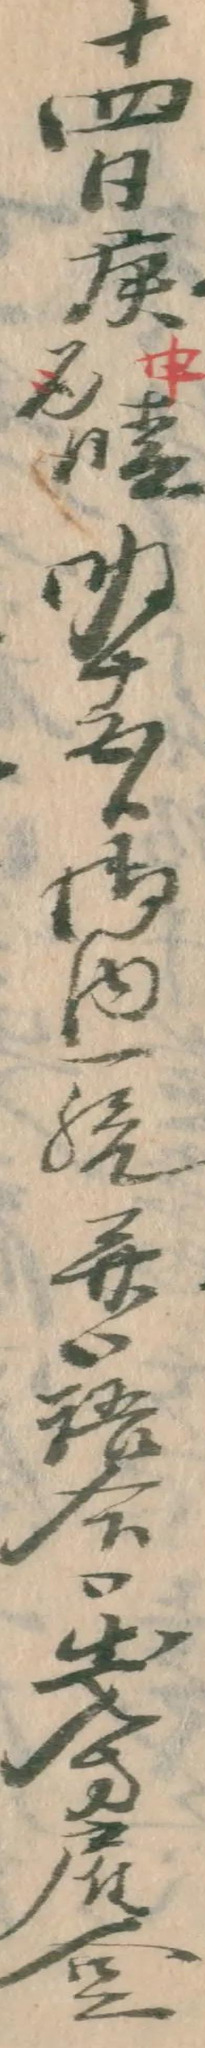十四日庚酉晴明十五日御内一統并御語合御出入方雇人足
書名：賀茂社記録. 第67冊
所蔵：国立国会図書館 National Diet Library, JAPAN
